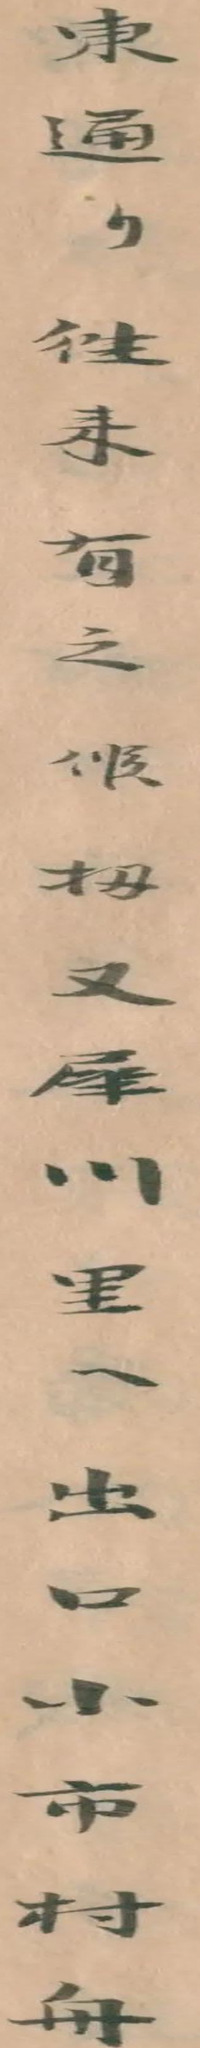東通リ往来有之候扨又犀川里ヘ出口小市村舟
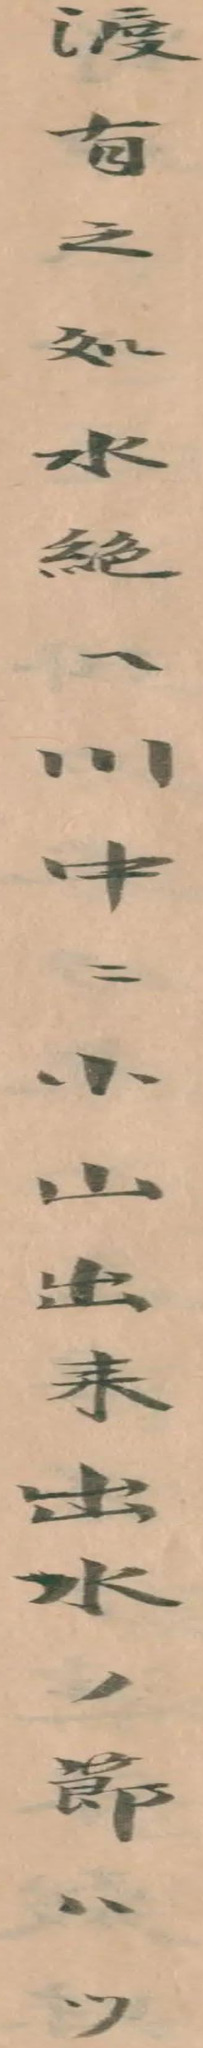渡有之処水絶ヘ川中ニ小山出来出水ノ節ハツ
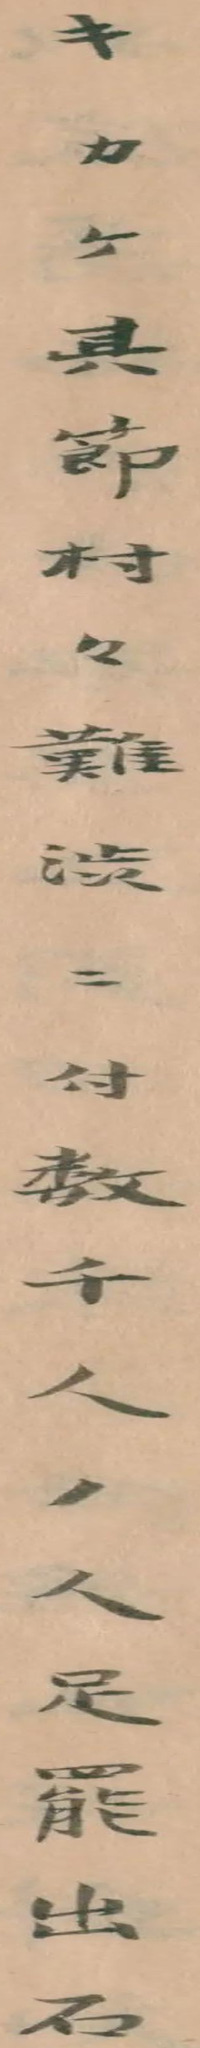キカケ其節村々難渋ニ付数千人ノ人足罷出石
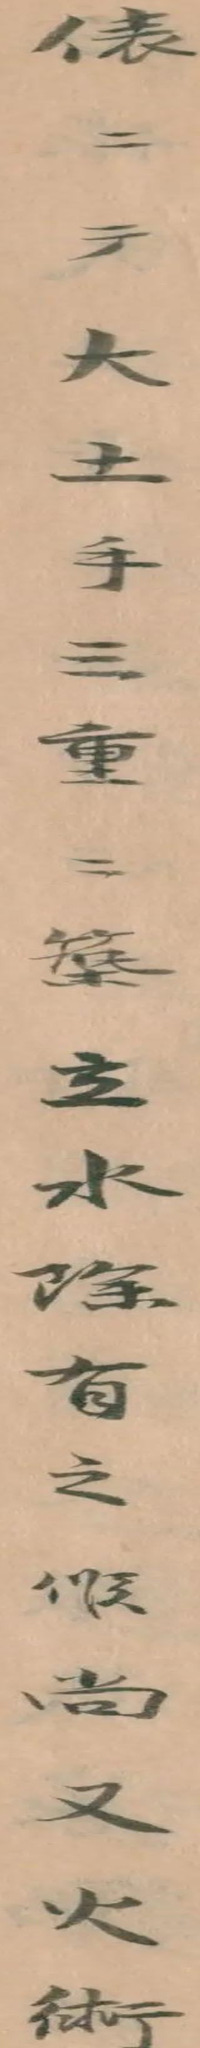俵ニテ大土手三重ニ築立水除有之候尚又火術
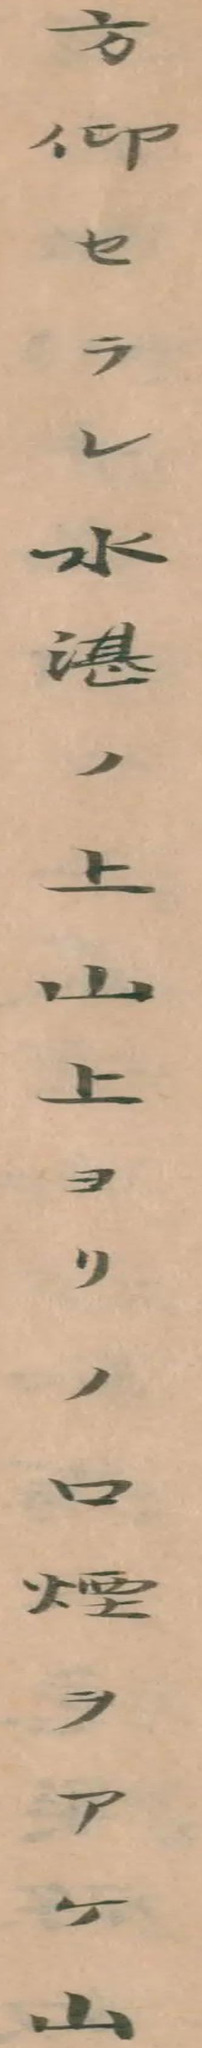方仰セラレ水湛ノ上山上ヨリノロ煙ヲアケ山
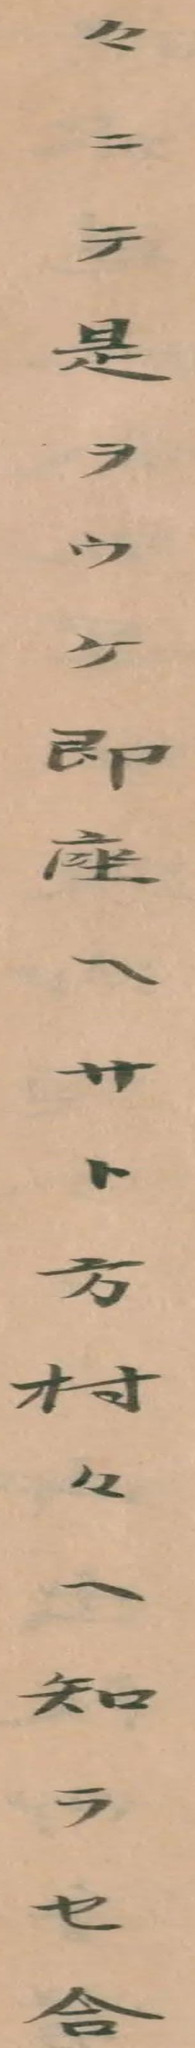々ニテ是をウケ即座ヘサト方村々ヘ知ラセ合
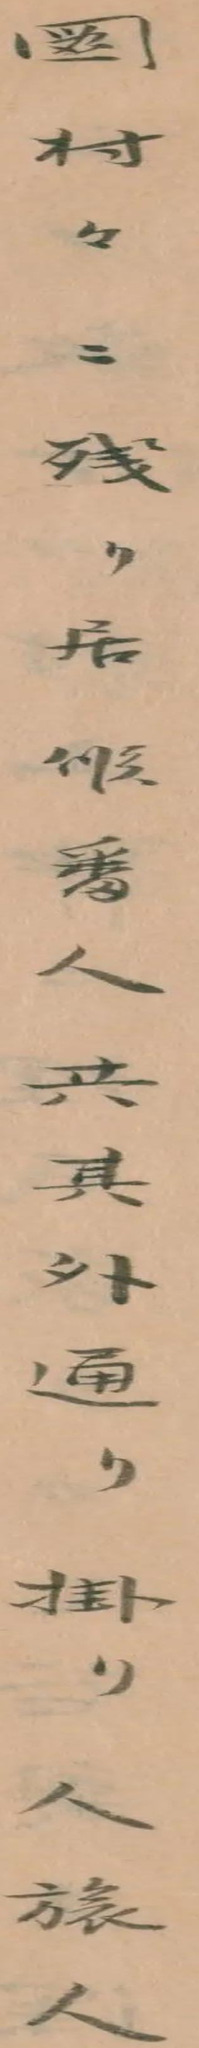図村々ニ残リ居候番人共其外通リ掛リ人旅人
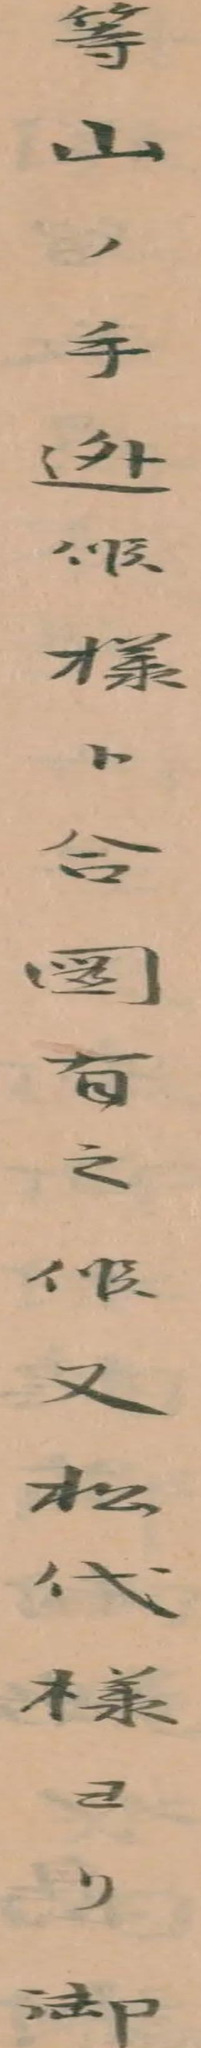等山ノ手逃候様ト合図有之候又松代様ヨリ御
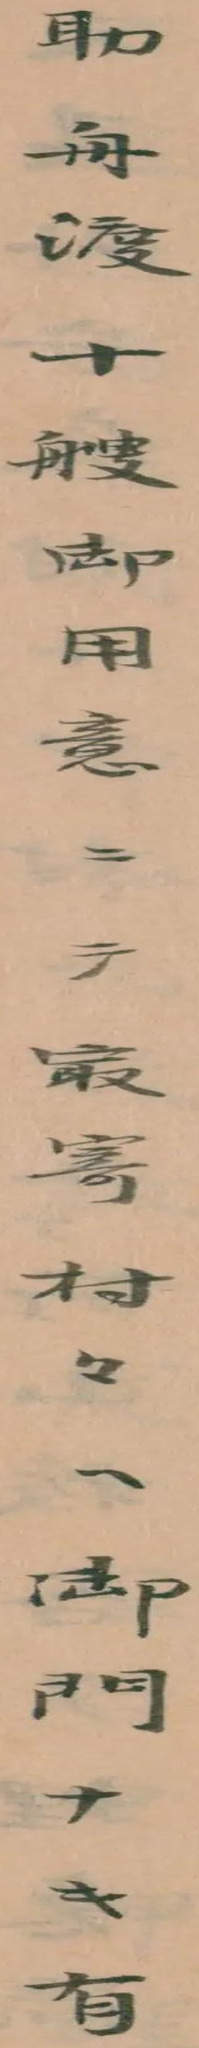助舟渡十艘御用意ニテ最寄村々ヘ御門ナキ有
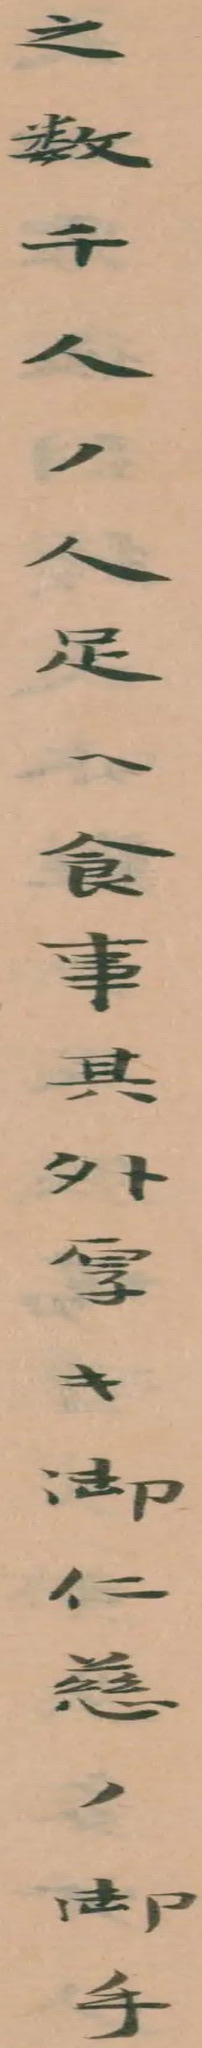之数千人ノ人足ヘ食事其外厚キ御仁慈ノ御手
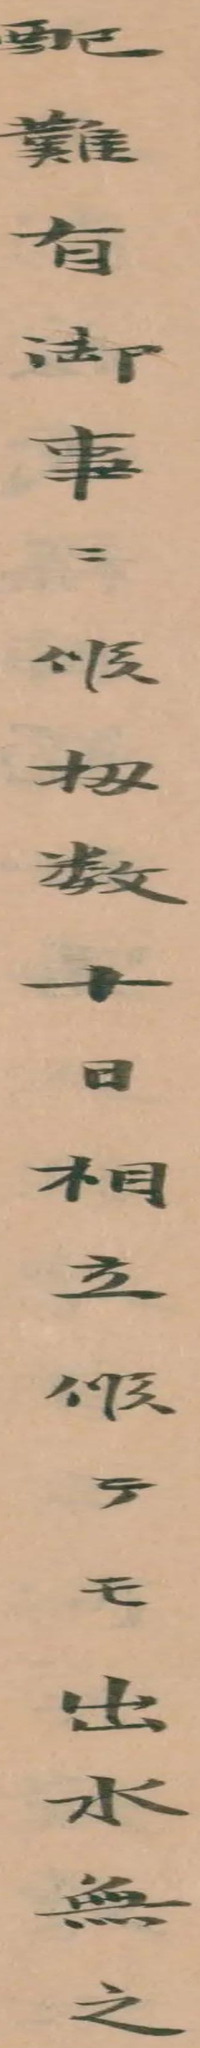配難有御事ニ候扨数十日相立候テモ出水無之
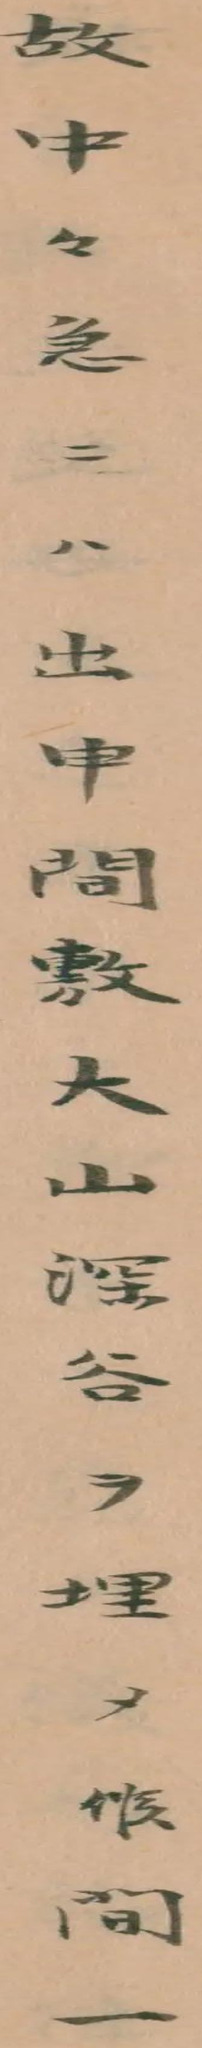故中々急ニハ出申間敷大山深谷ヲ埋メ候間一
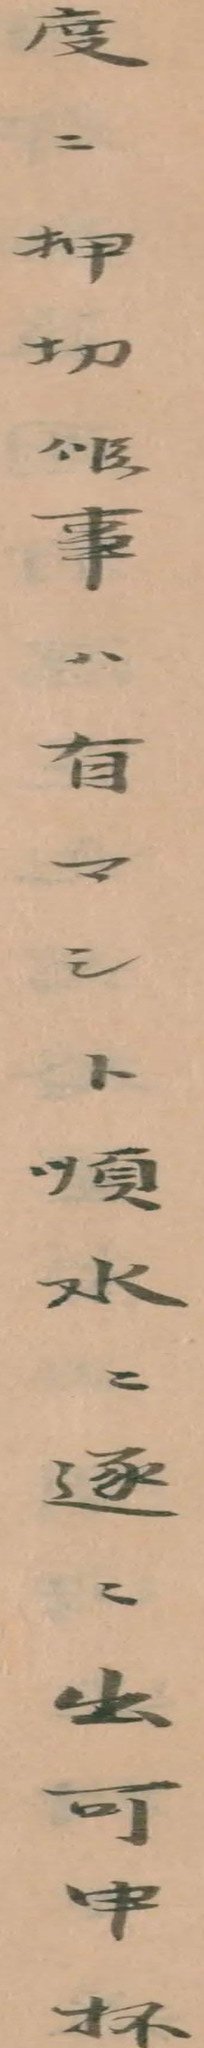度ニ押切候事ハ有マシト順水ニ逐ニ出可申杯
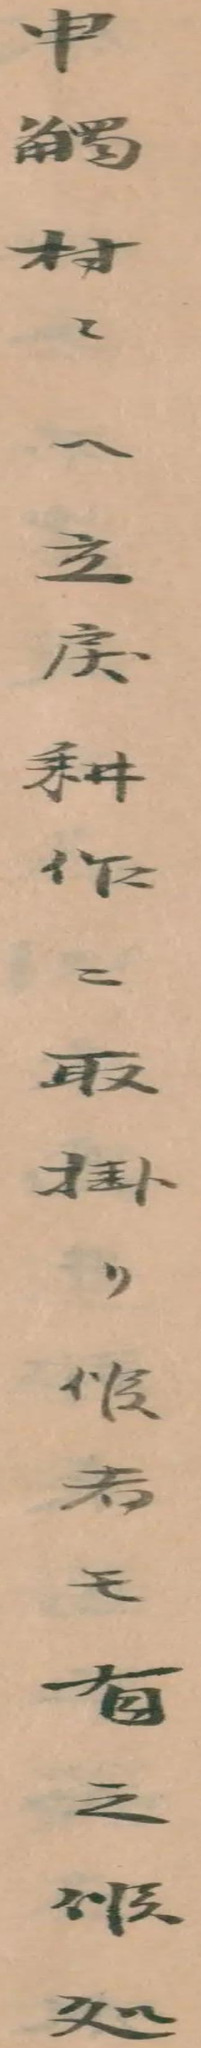申触村々ヘ立戻耕作ニ取掛リ候者モ有之候処
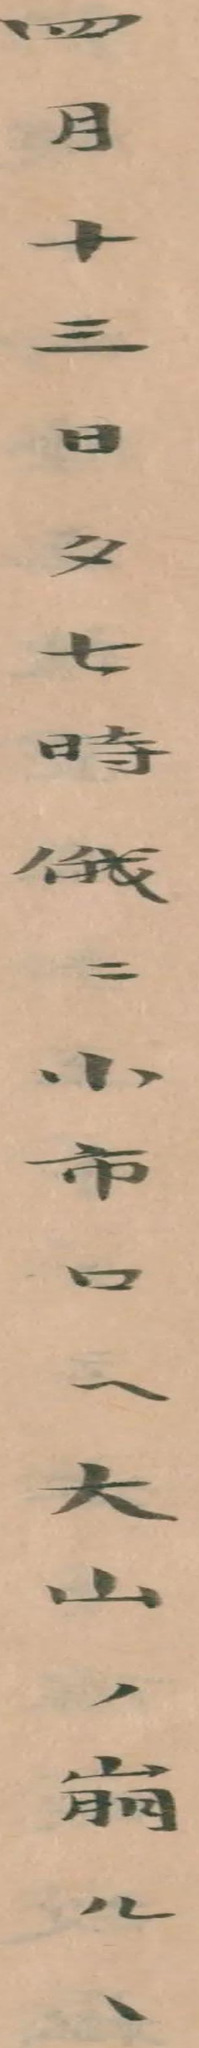四月十三日夕七時俄ニ小市口ヘ大山ノ崩ルヽ
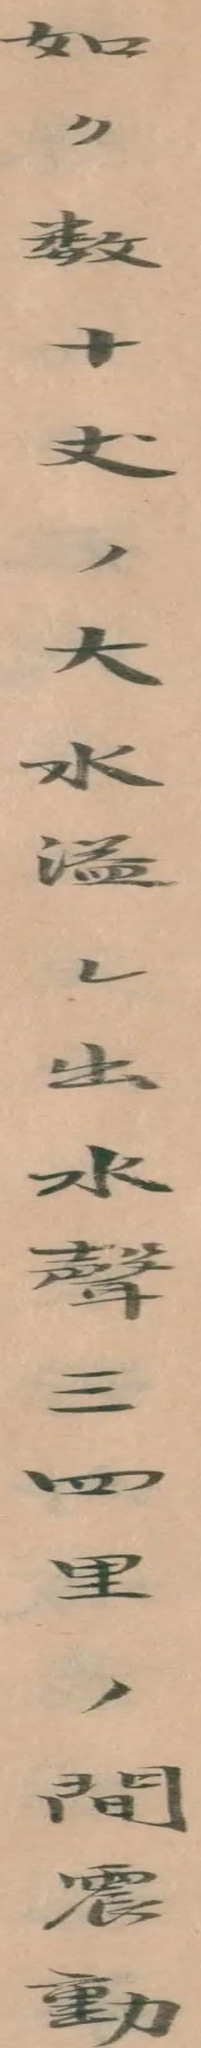如ク数十丈ノ大水湛レ出水声三四里ノ間震動
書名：地災撮要. 巻5-6(地震之部)
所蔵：国立国会図書館 National Diet Library, JAPAN
